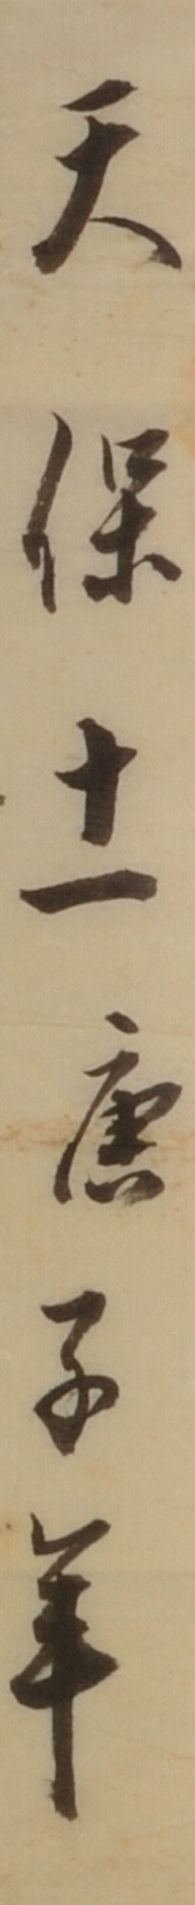天保十一庚子年
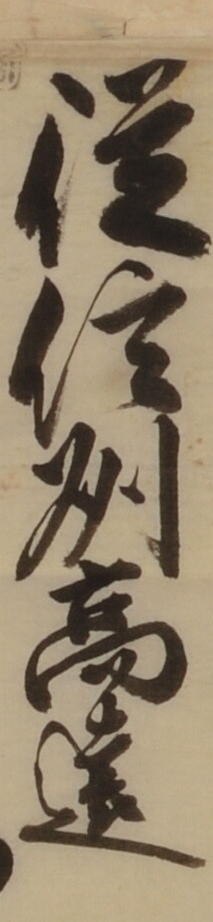従信州高遠
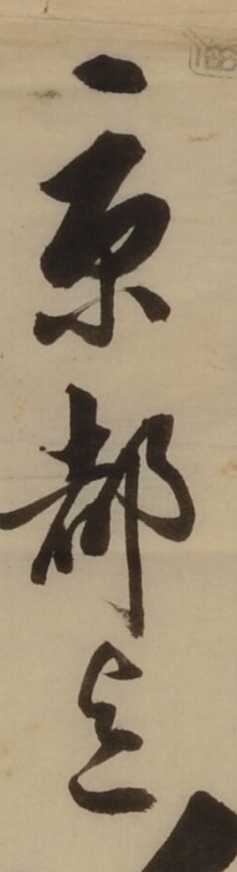京都迄
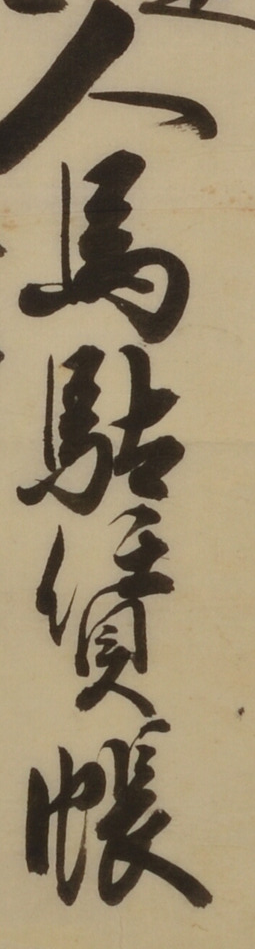人馬駄賃帳
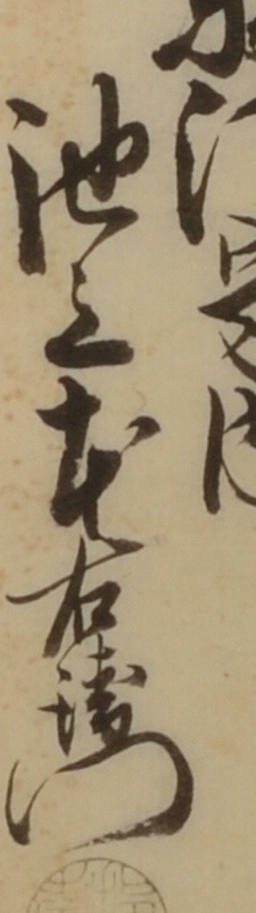池上本右衛門

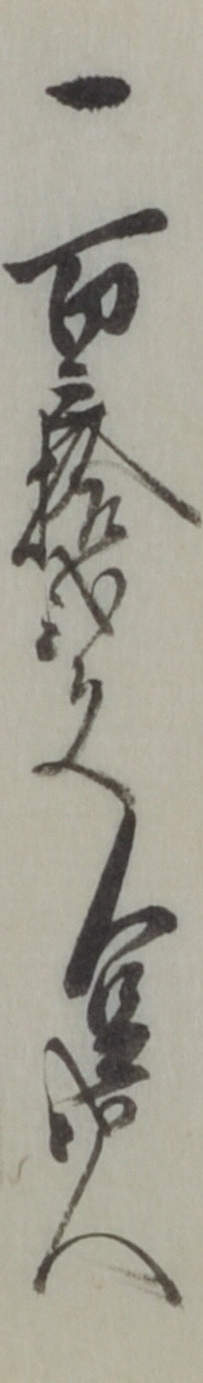一百三拾弐文人足弐人
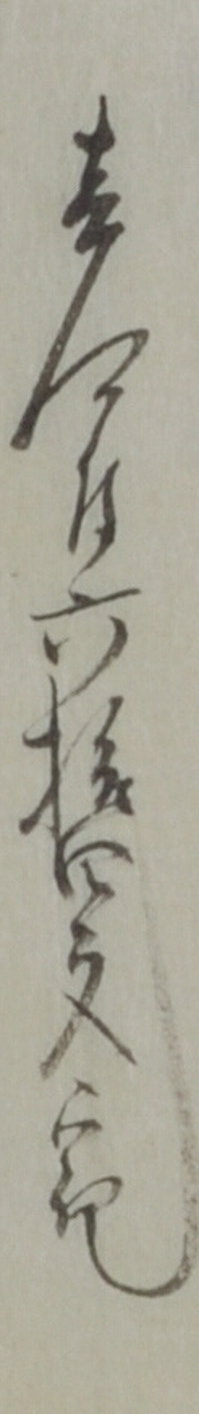壱人ニ付六拾四文宛
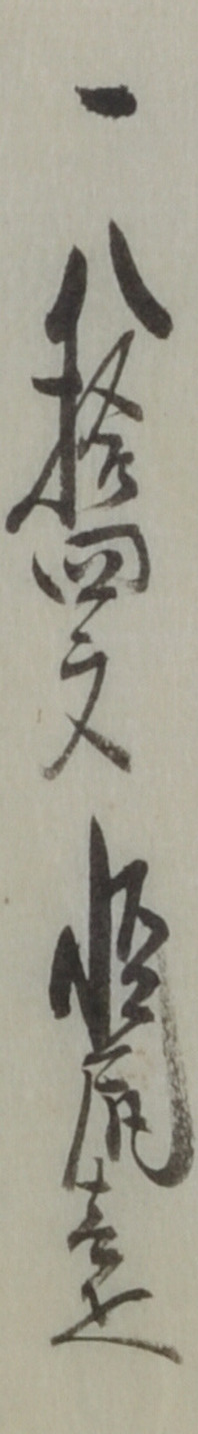一八拾四文軽尻壱疋
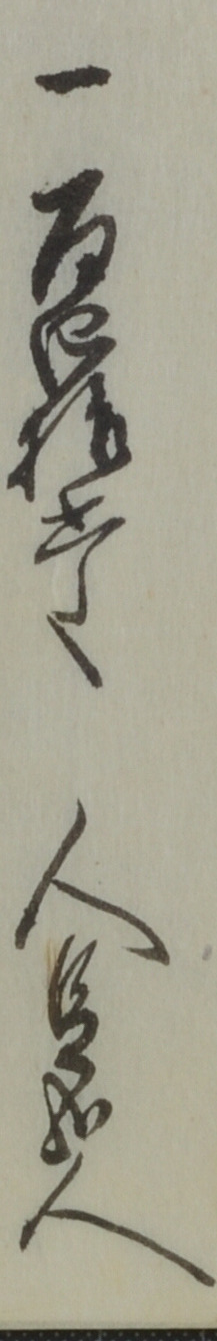一百四拾六文人足弐人
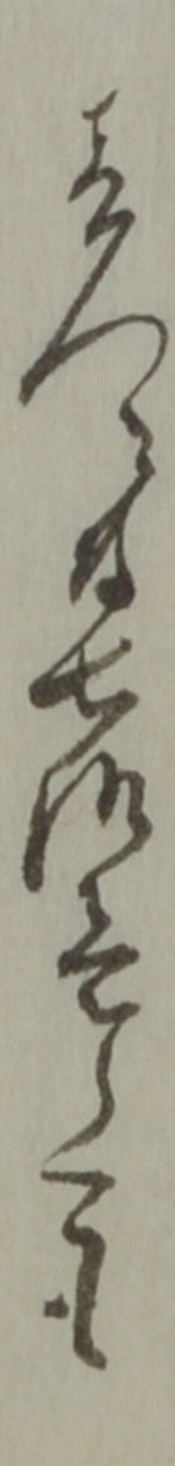壱人二付七拾壱文ツヽ
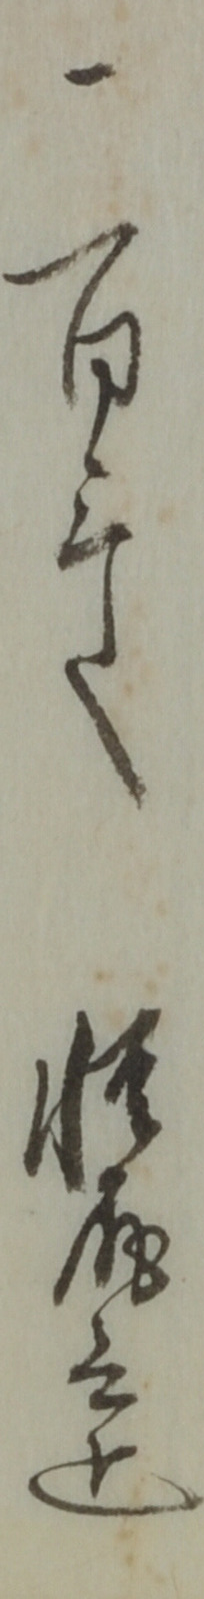一百三匁軽尻壱疋
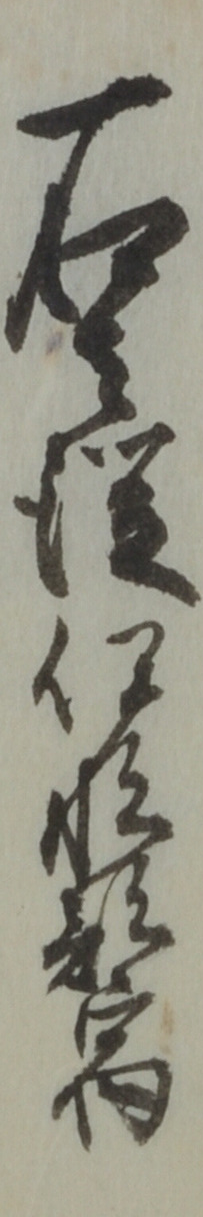右は従伊那部宿
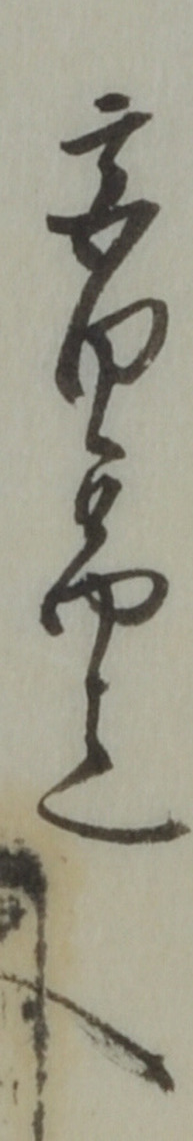宮田宿迄
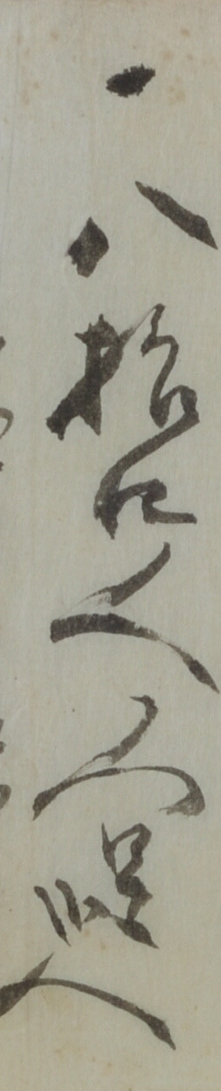一八拾四人人足弐人
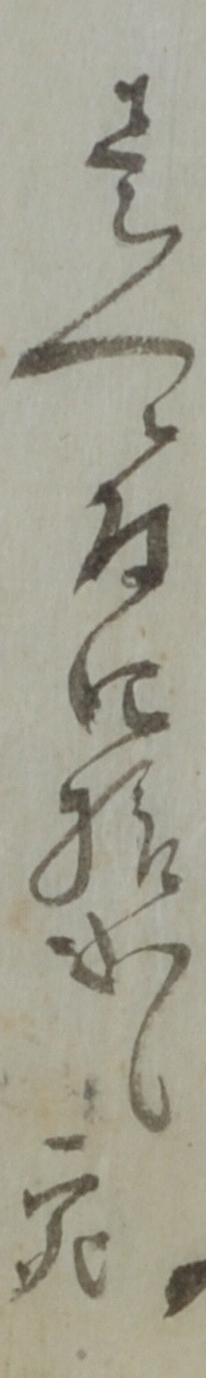壱人ニ付四拾弐文宛

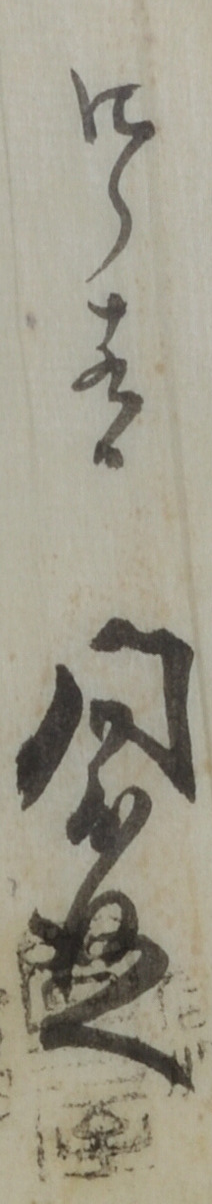四月十九日問屋役人
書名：従信州高遠京都迠人馬駄賃帳
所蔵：伊那市立高遠町図書館・合同会社AMANE
